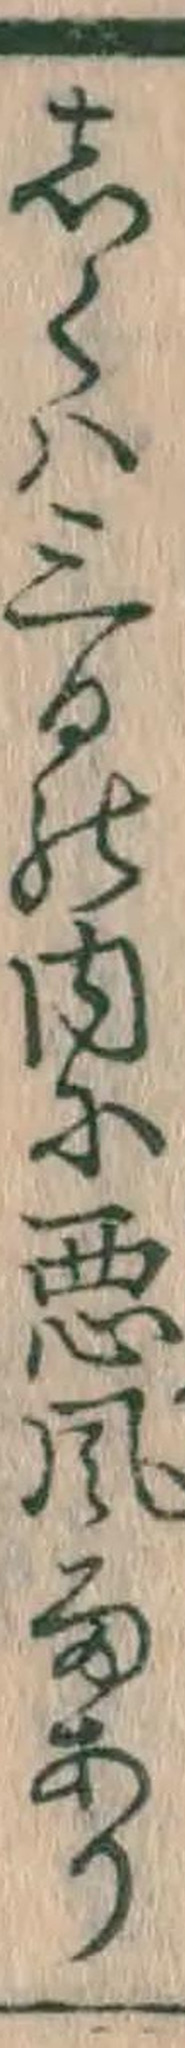しくは三日の内に悪風雨あり
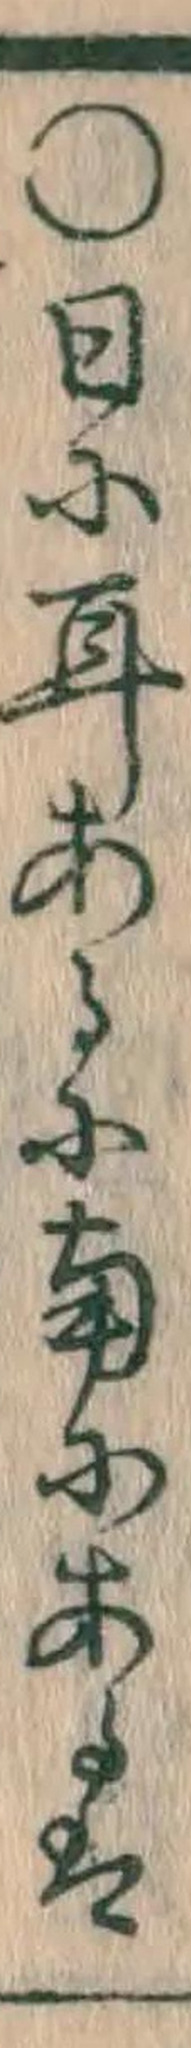○日に耳あるに南にあるは
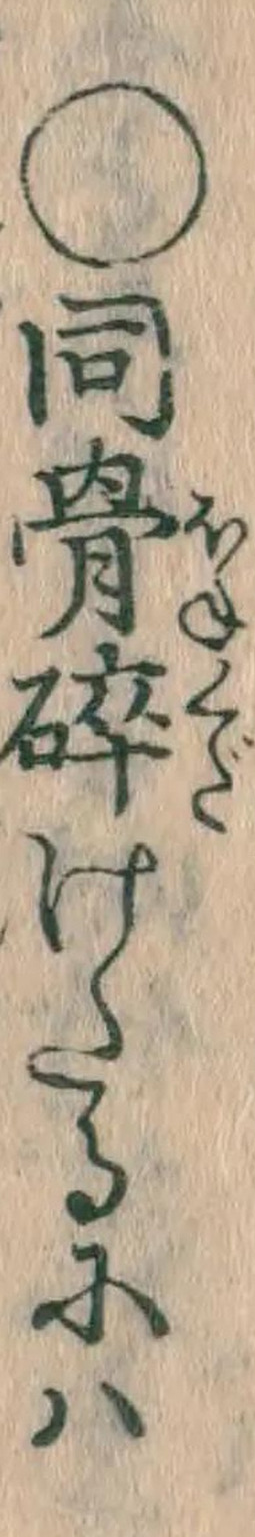○同骨砕けたるには
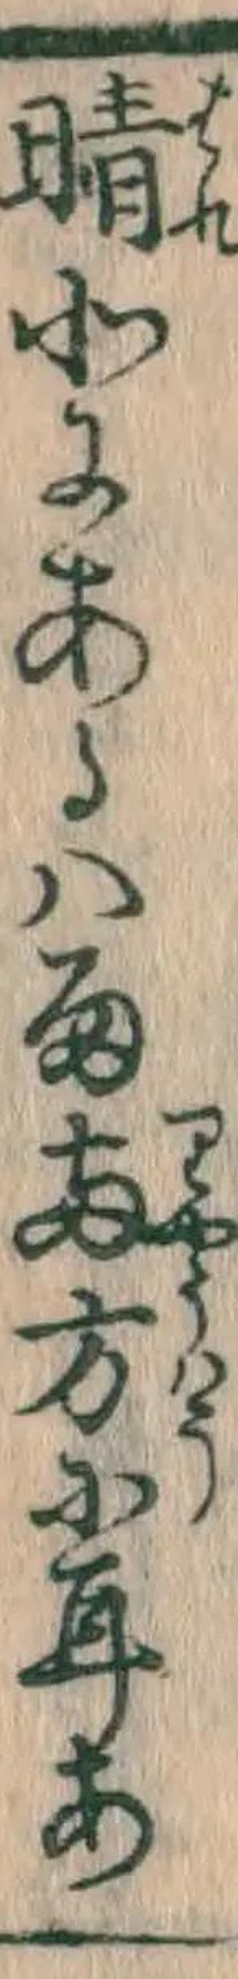晴北にあるは雨両方に耳あ
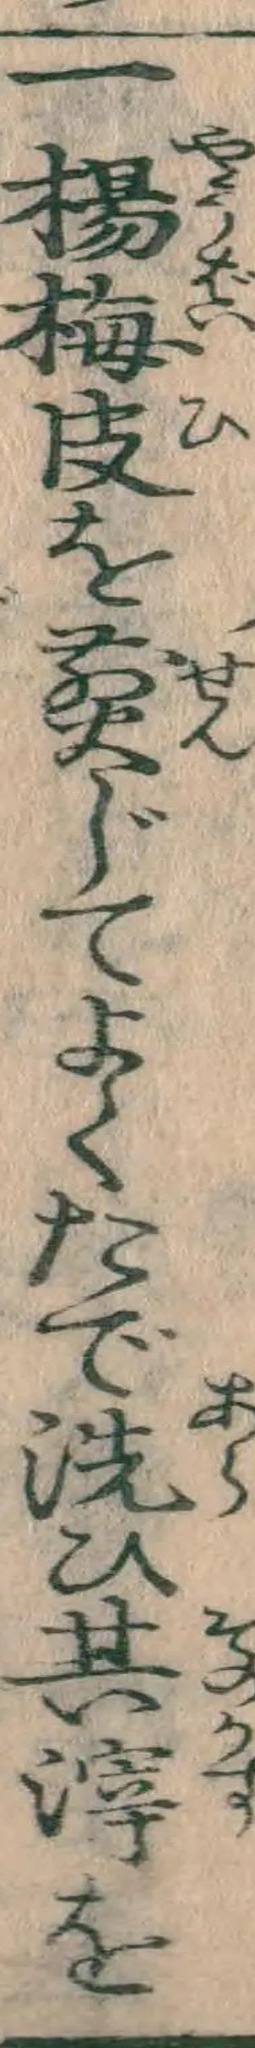一楊梅皮を煎じてよくたで洗ひ其滓を
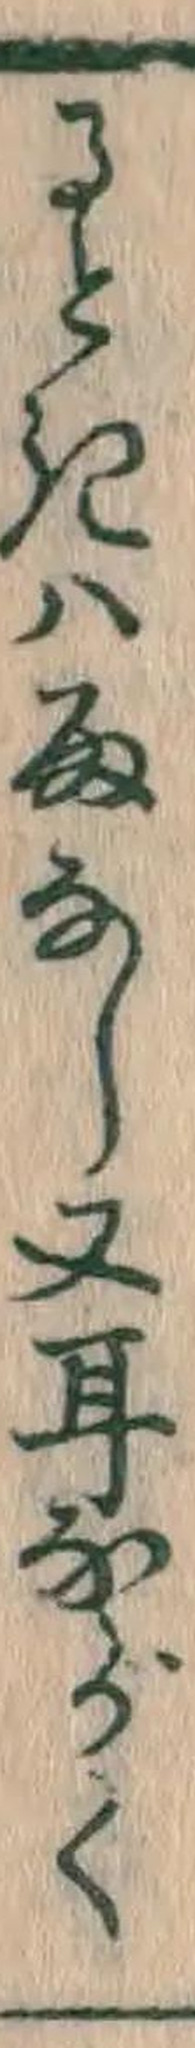るときは雨なし又耳ながく
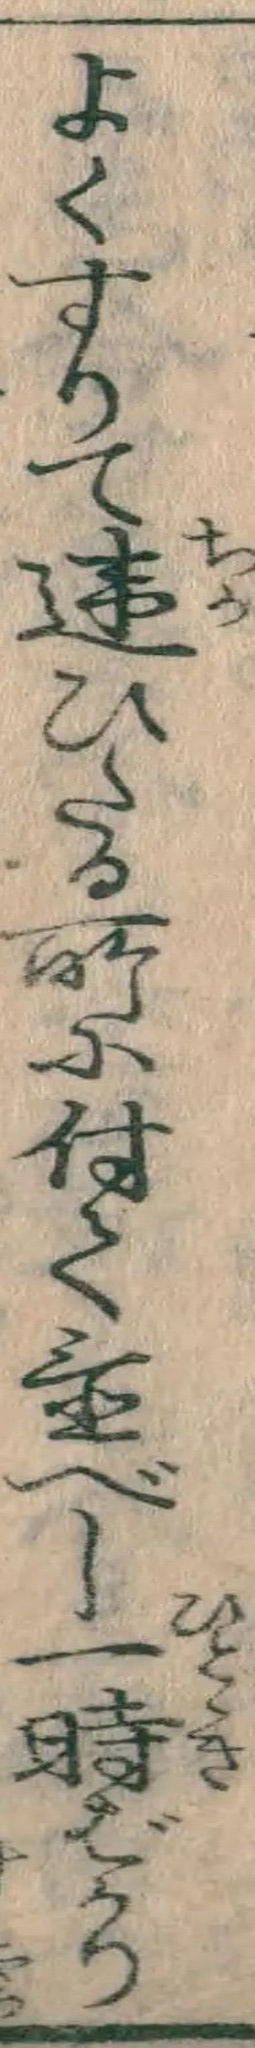よくすりて違ひたる所に付て置べし一時ばかり
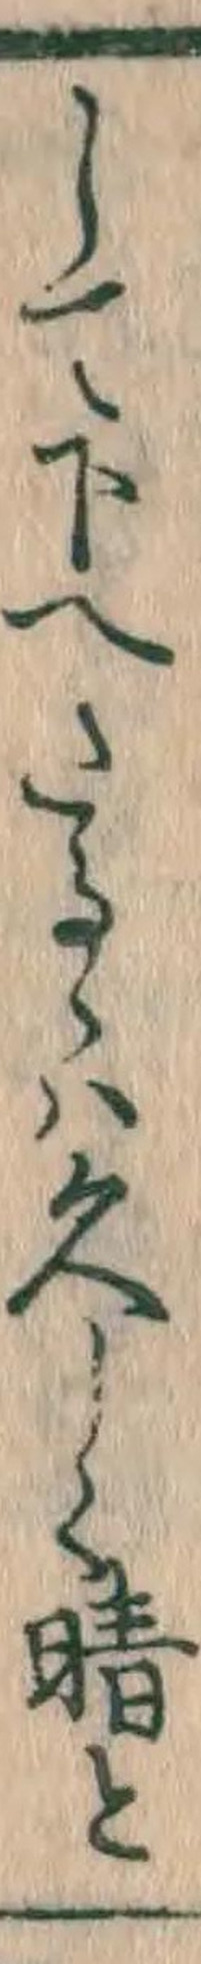して下へたるゝは久しく晴と
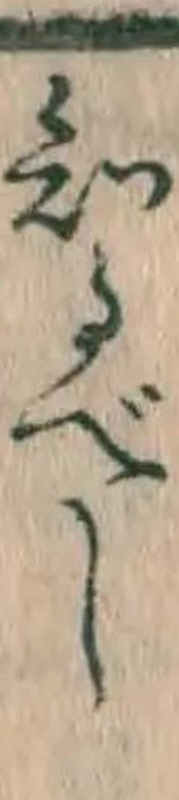知るべし
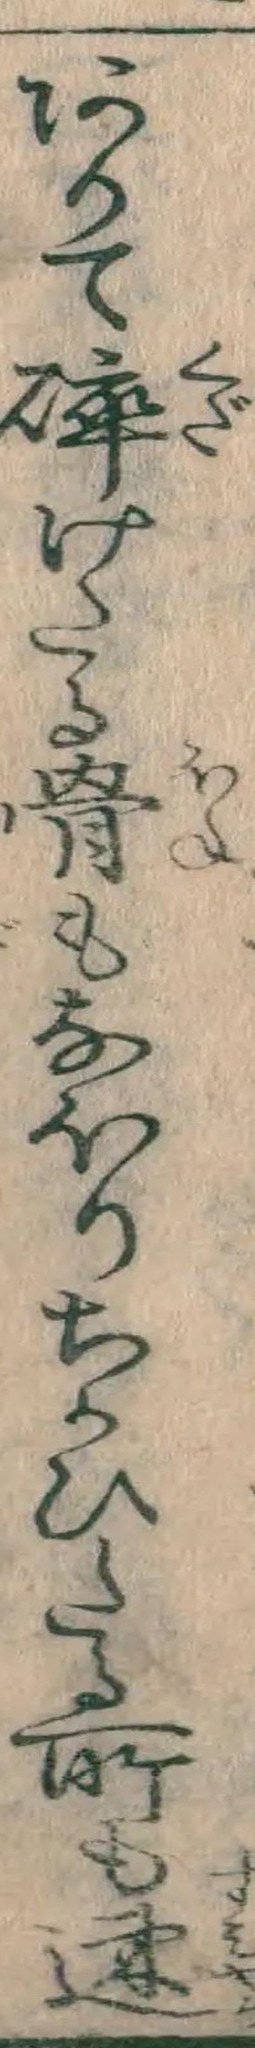ありて砕けたる骨もなほりちかひたる所も速
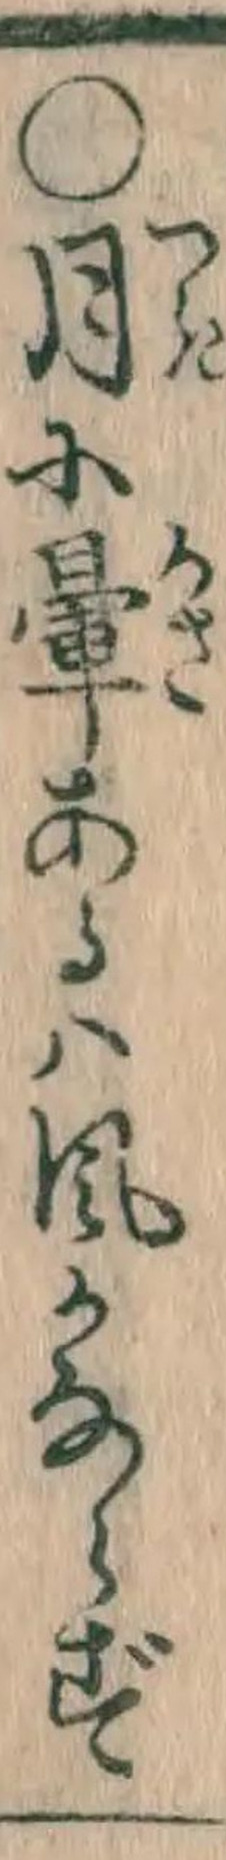○月に暈あるは風かならず

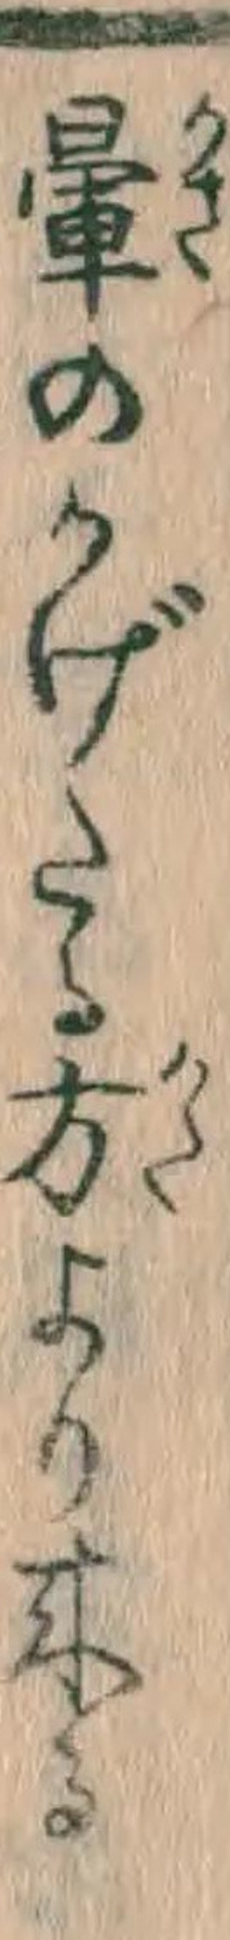暈のかげたる方より来る
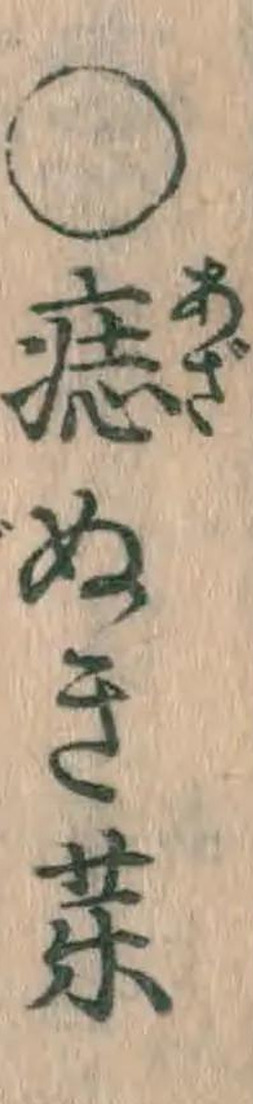○痣ぬき薬
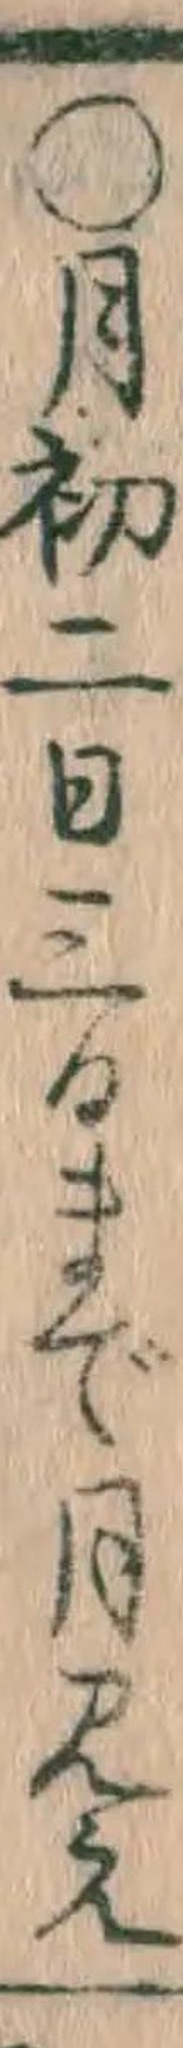○月初二日三日まで月見え
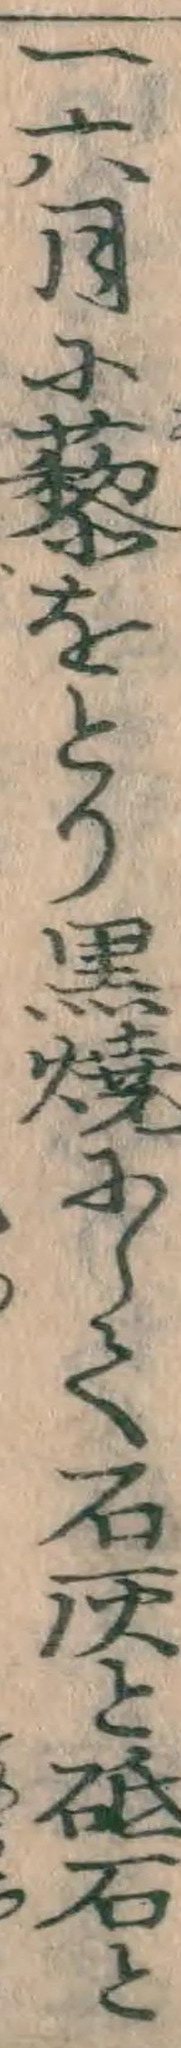一六月に藜をとり黒焼にして石灰と砥石と
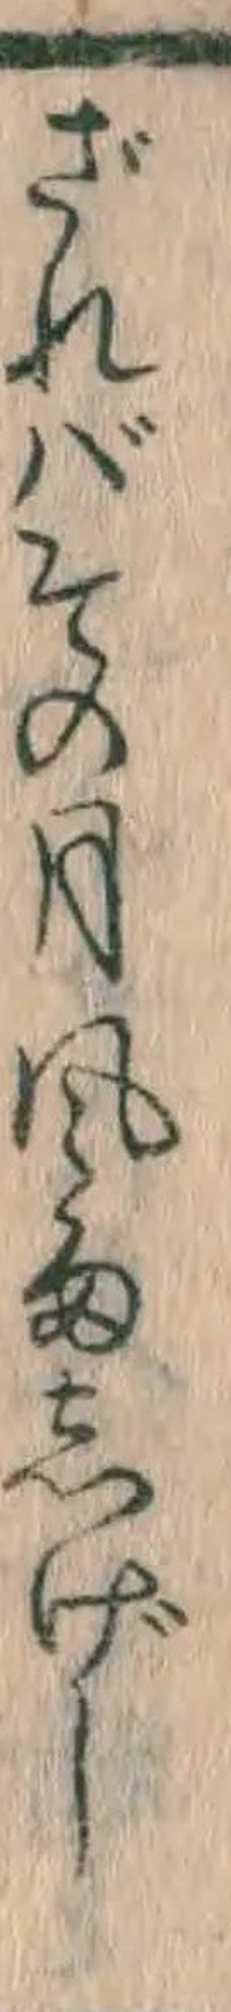ざればその月風雨しげし
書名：広益秘事大全 3巻. [3]
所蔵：国立国会図書館 National Diet Library, JAPAN
